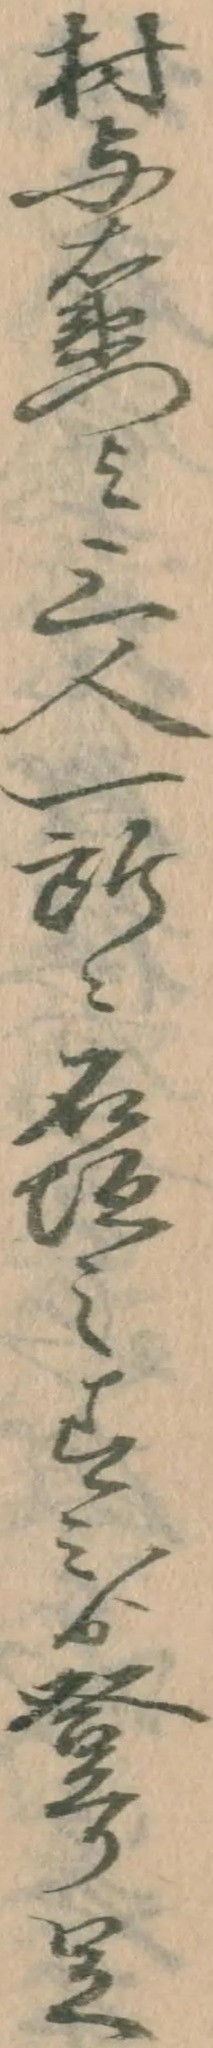村与右衛門与三人一所に石垣の春みゟ登り足
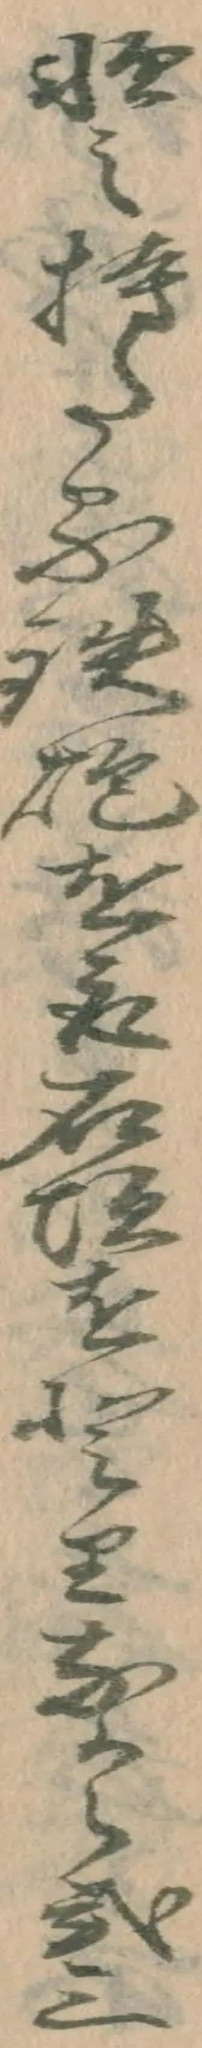軽之持た累鉄炮を取石垣を登里なから弐三
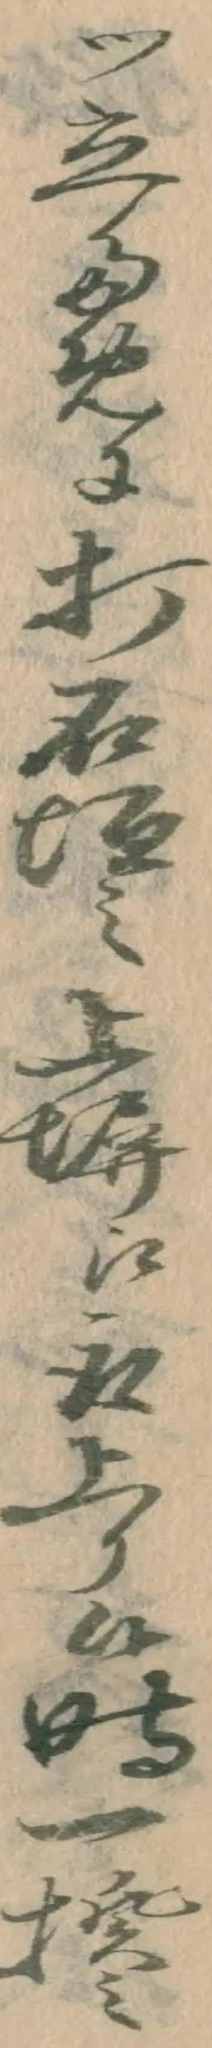つ立太多免尓打石垣之上塀江取上り候時一揆之
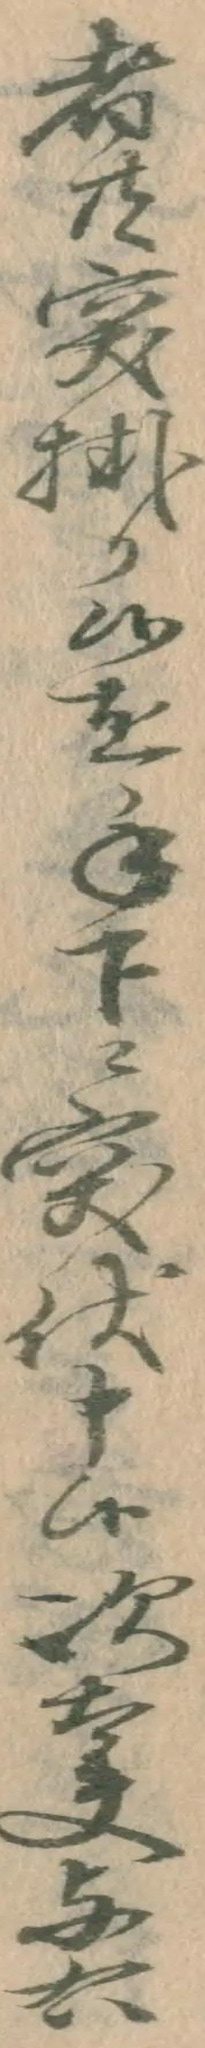者共突掛り候を手下に突伏申候次太夫与右
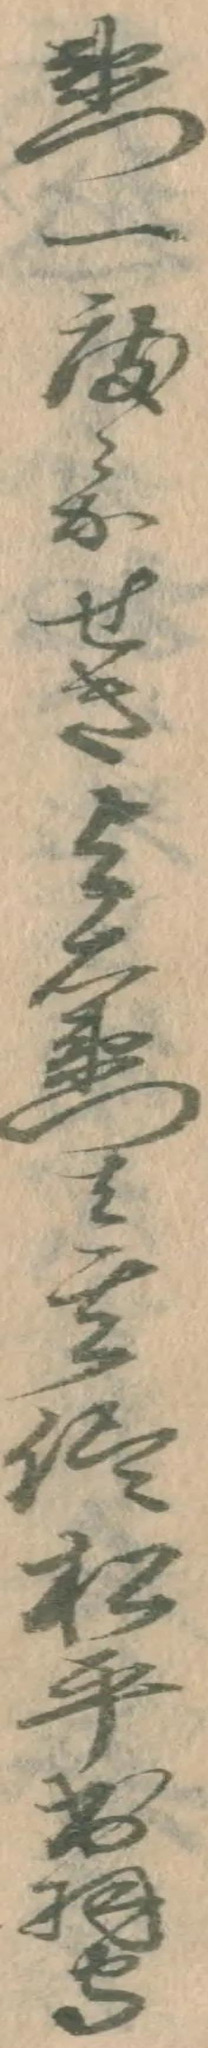衛門一度にかせき与右衛門者其侭町平出羽守
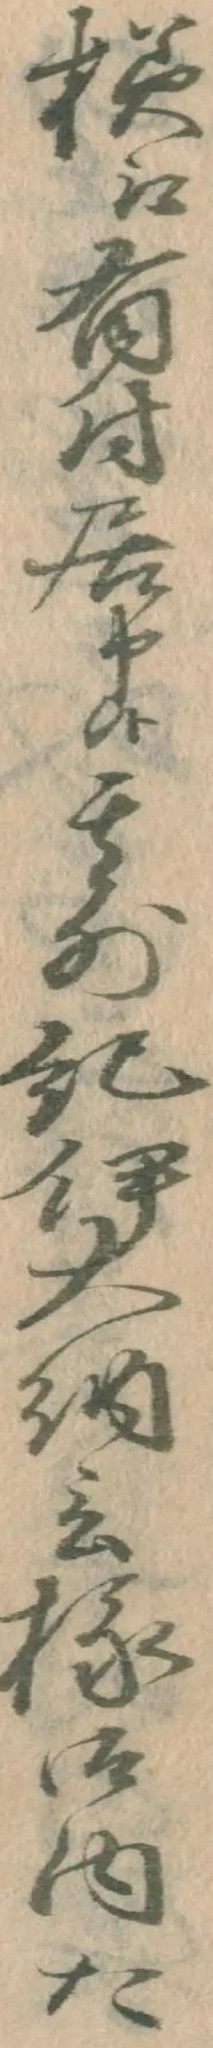様江有付居申候其外紀伊大納言様御内た
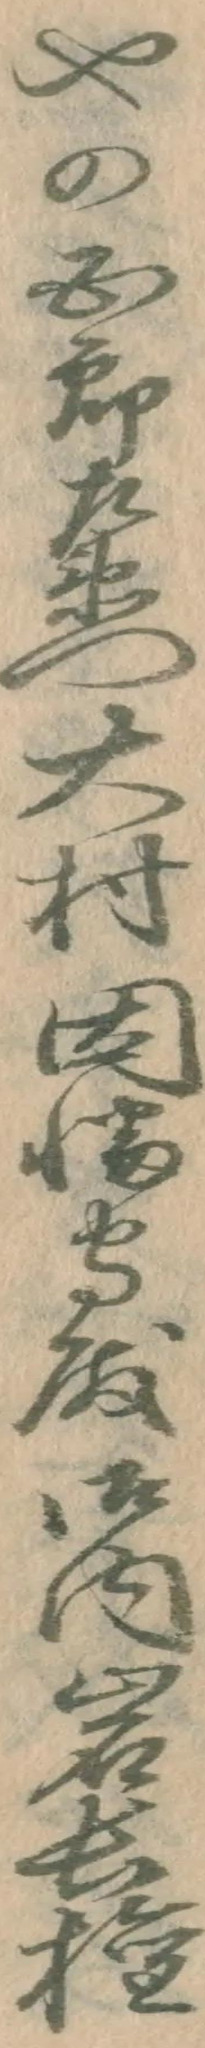やの五郎左衛門大村因幡守殿御内岩長権
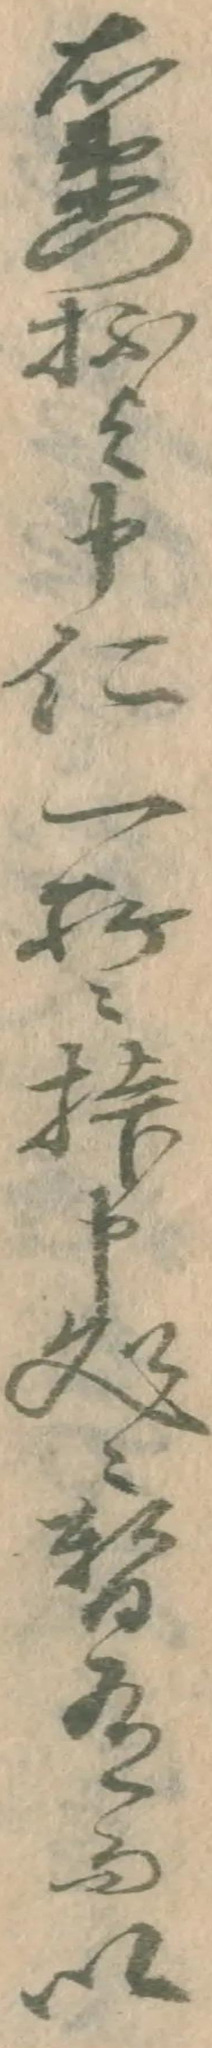右衛門抔与申仁一所に挊申処に暫有而以
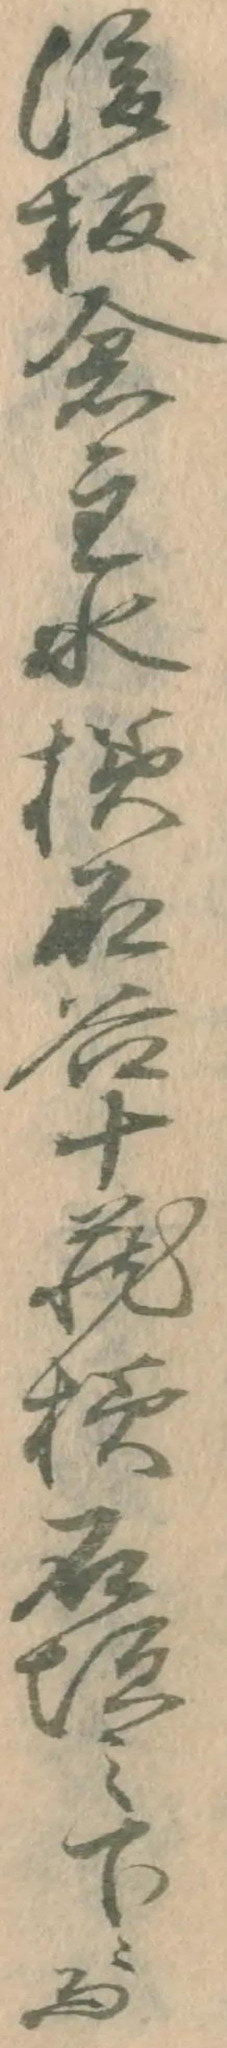後板倉主水様石谷十蔵様石垣之下に而

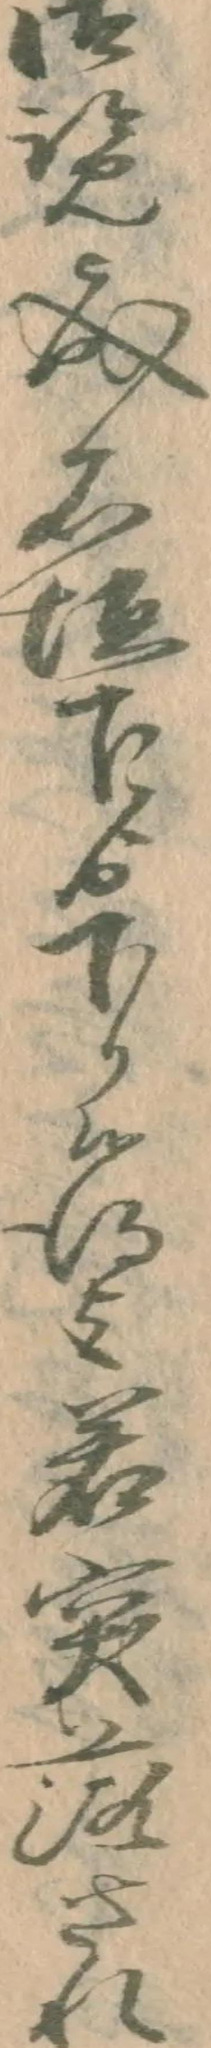御覧被成石垣下ゟ下り候得与若突落され
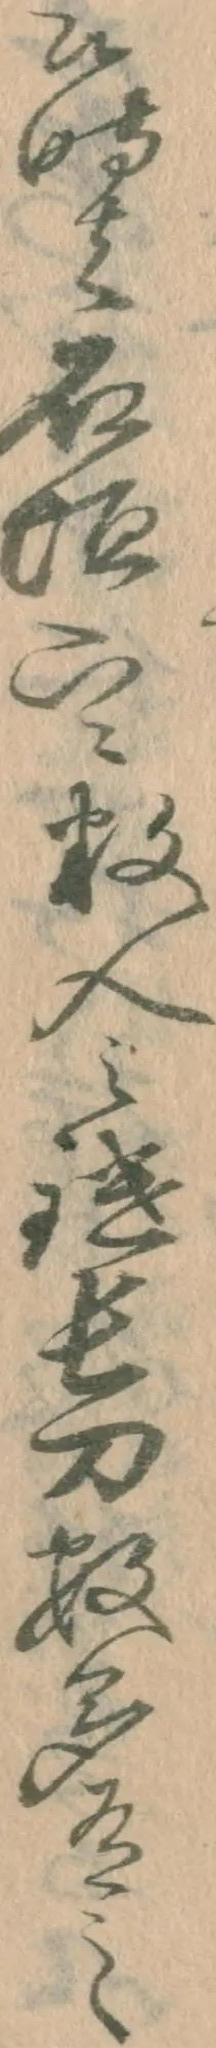候時者石垣下に数人之鑓長刀余多有之
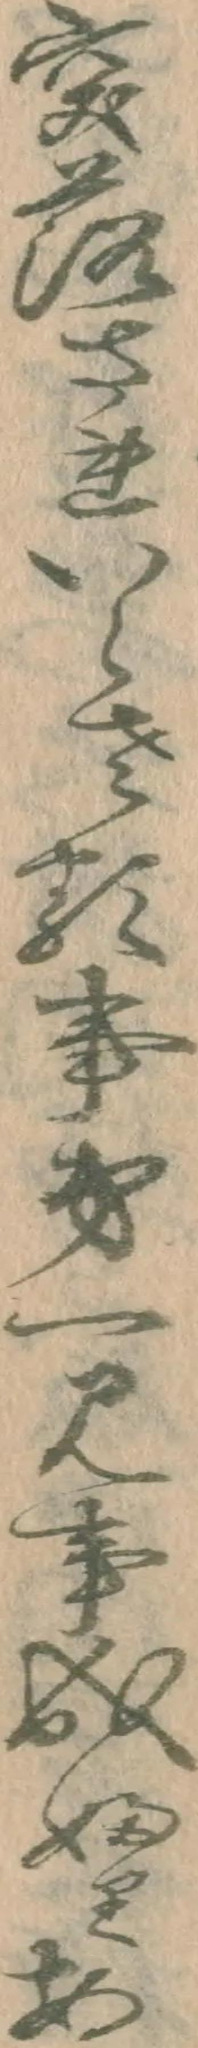突落さ連いらさ類事第一見事成婦里あ
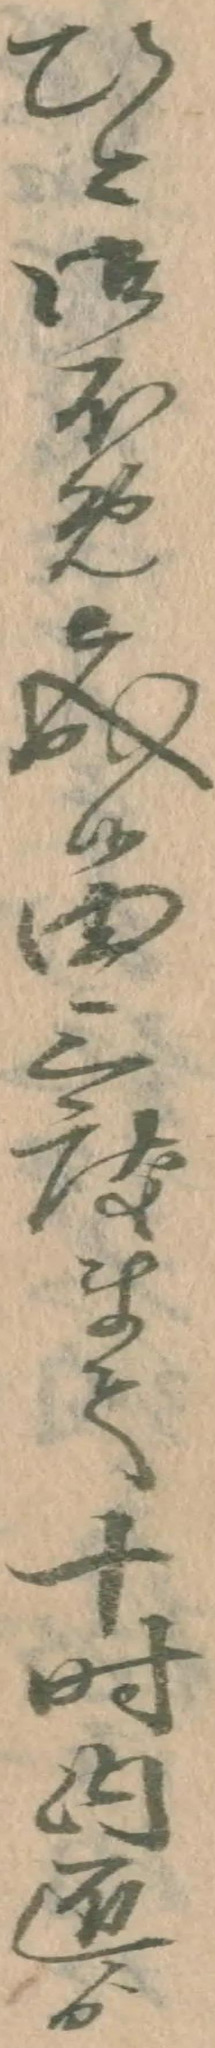ひと御不免被成候由三度まて十時内匠ゟ
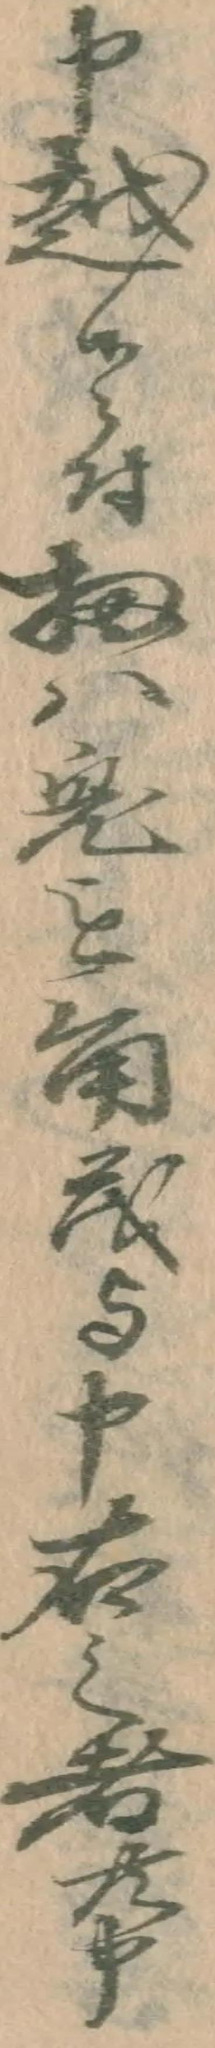申越候に付扨は兎も角茂与申右之者共申
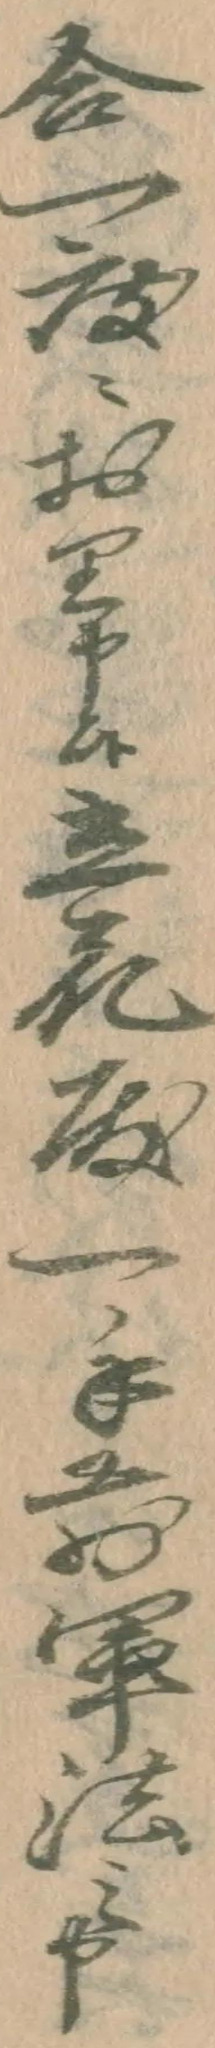合一度にお里申候立花殿一手前軍法之申
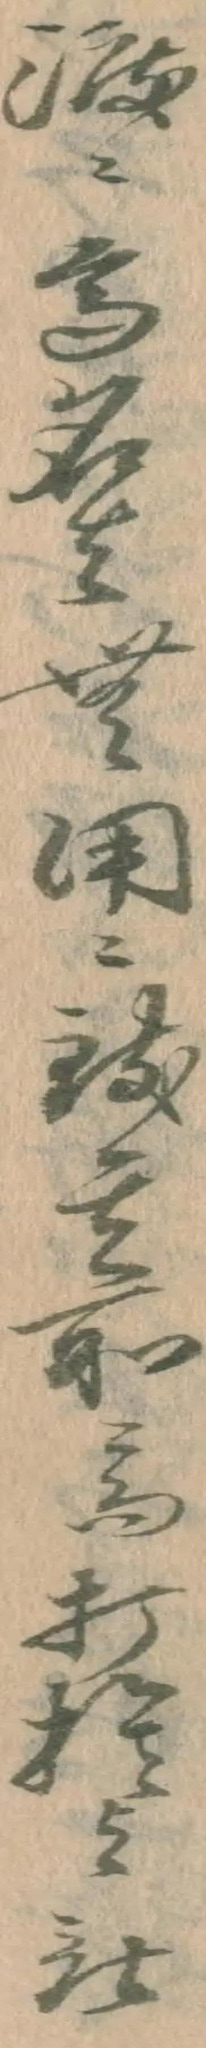渡に高名者無用に致其所に而打捨与被
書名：切支丹御退治記 49巻. [8]
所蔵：国立国会図書館 National Diet Library, JAPAN
